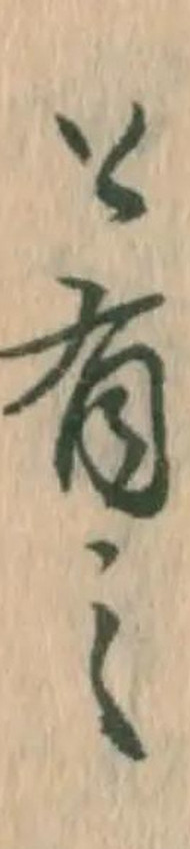と有之
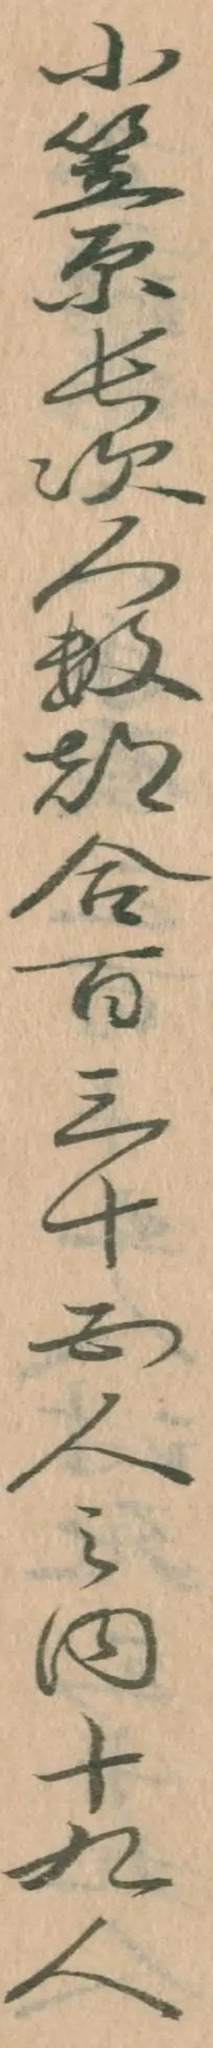小笠原長次人数都合百三十五人之内十九人
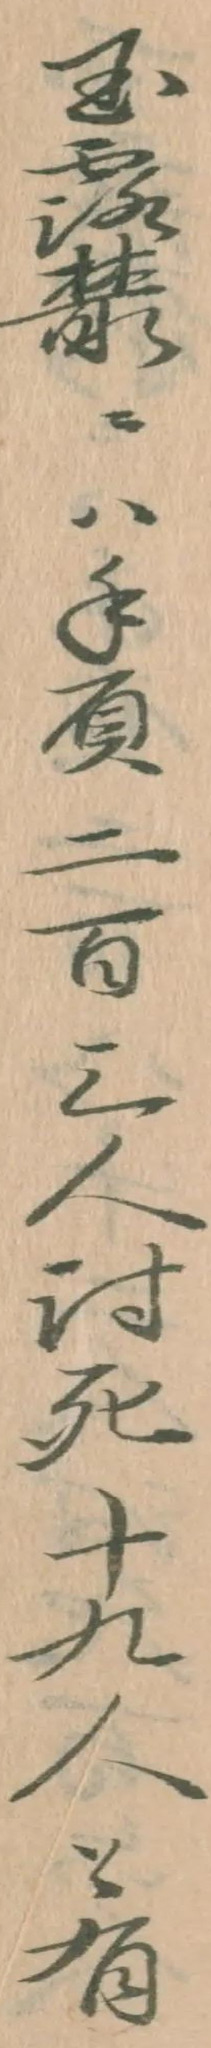玉露樷には手負二百三人討死十九人と有
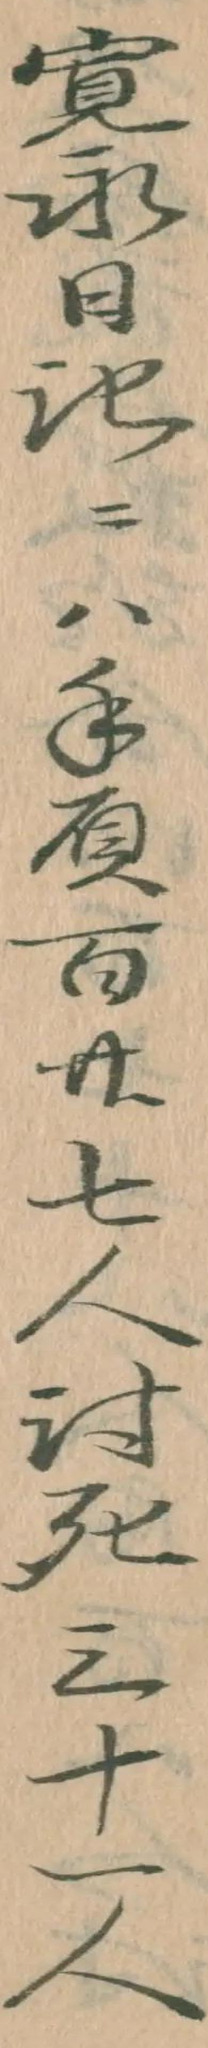寛永日記には手負百廿七人討死三十一人
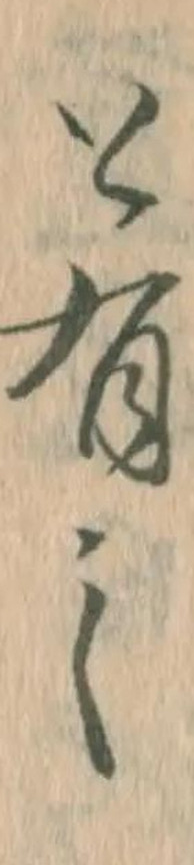と有之
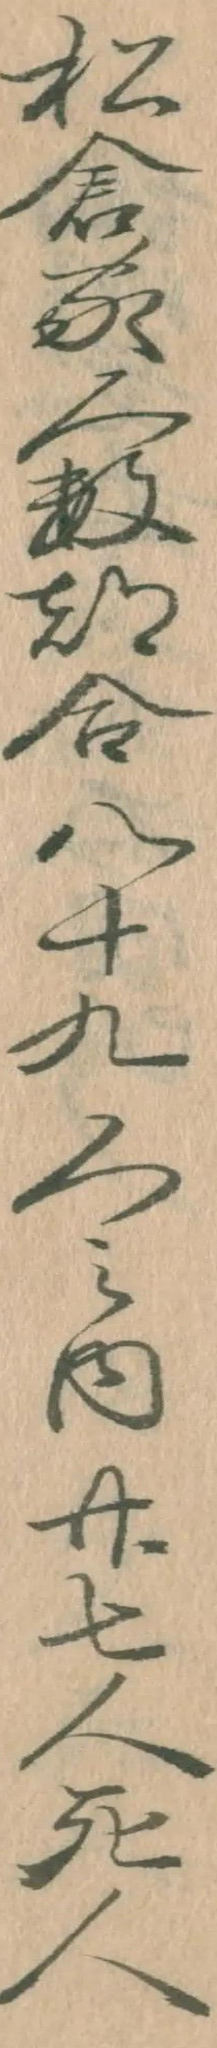松倉家人数都合八十九人之内廿七人死人
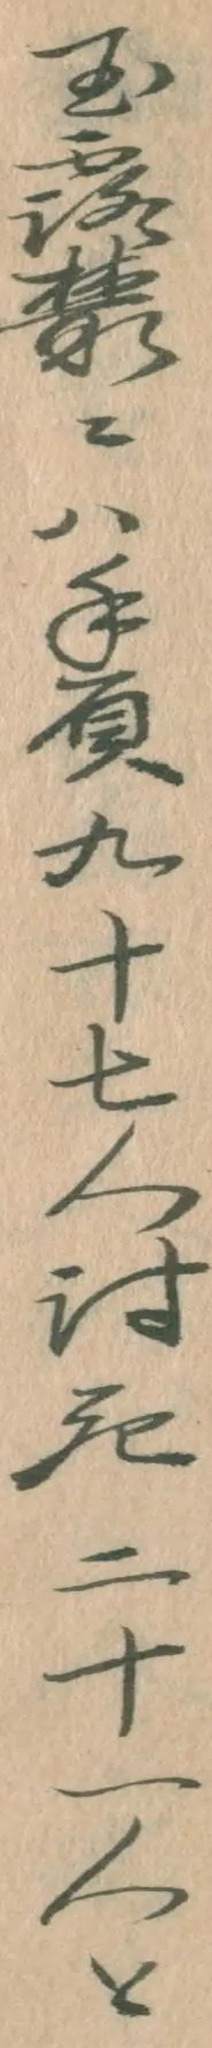玉露樷には手負九十七人討死二十一人と
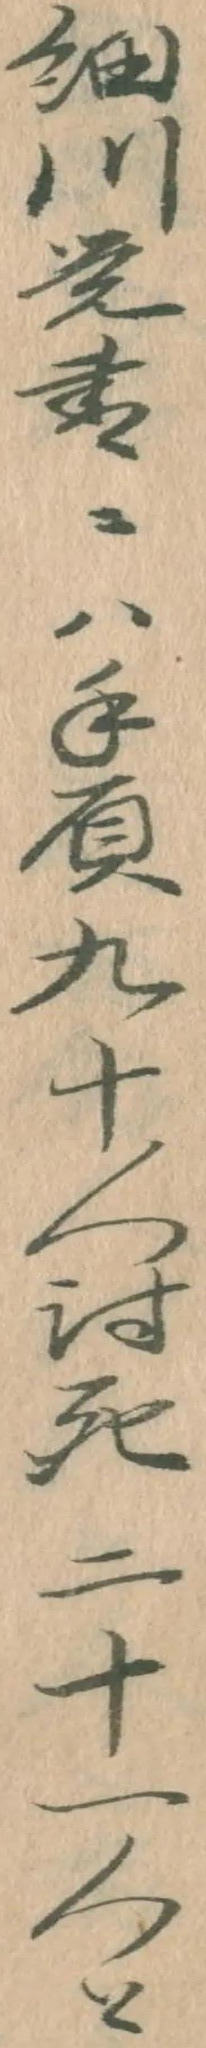細川覚書には手負九十人討死二十一人と
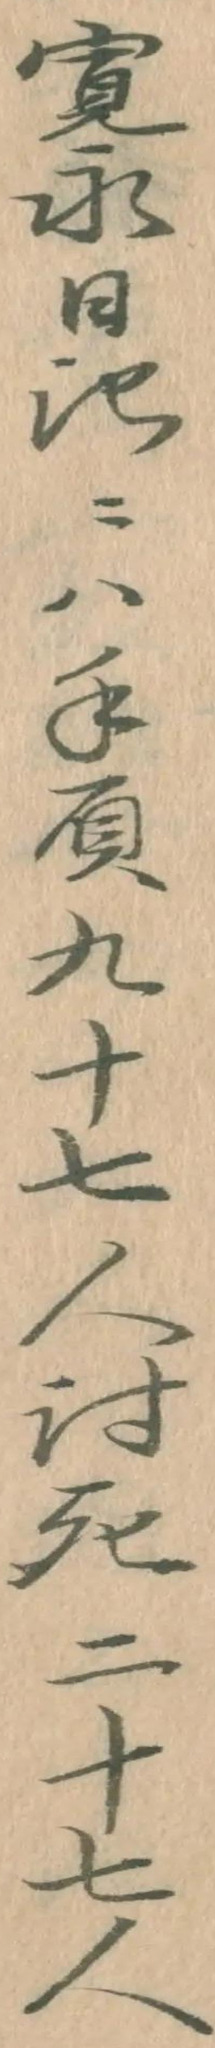寛永日記には手負九十七人討死二十七人

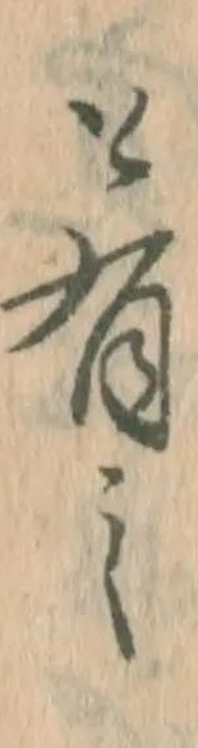と有之
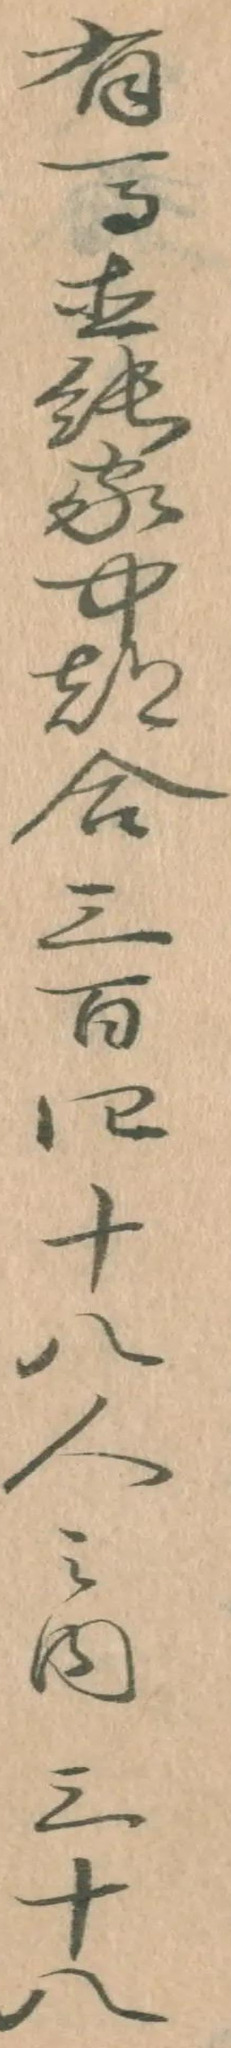有馬直純家中都合三百四十八人之内三十八
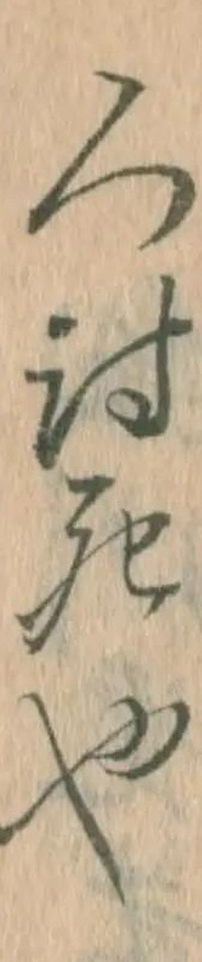人討死也
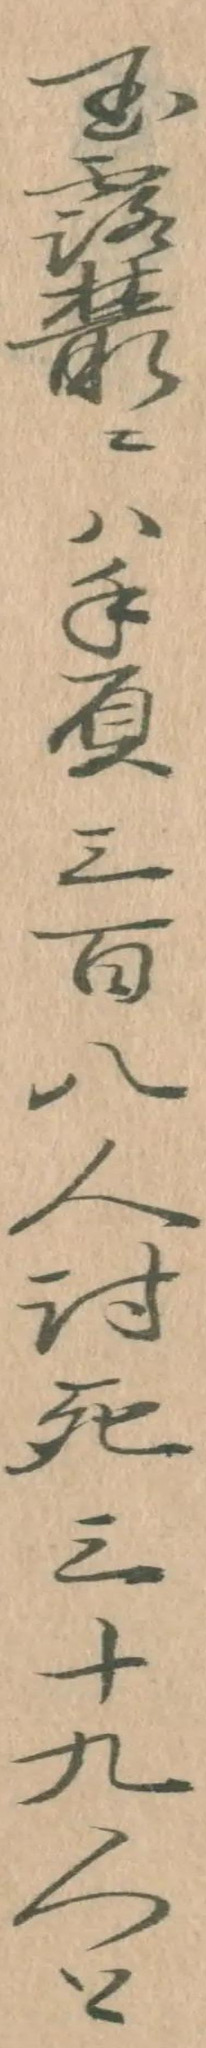玉露樷には手負三百八人討死三十九人と
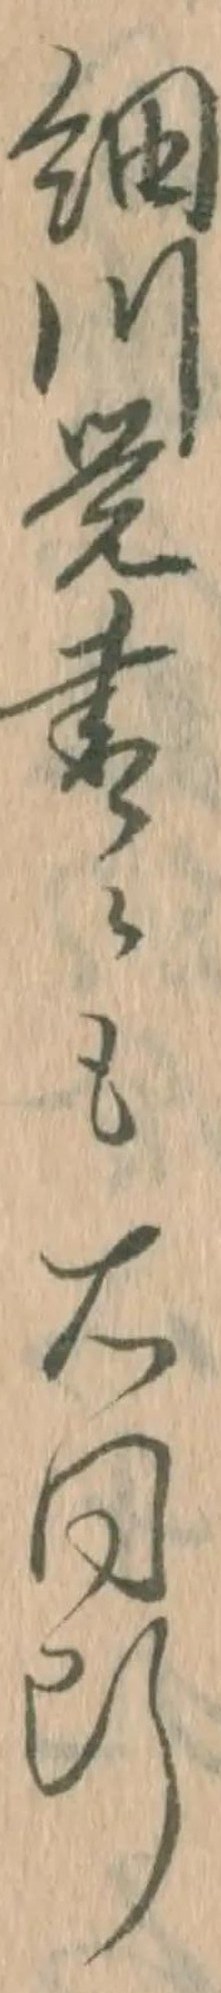細川覚書にも右同断
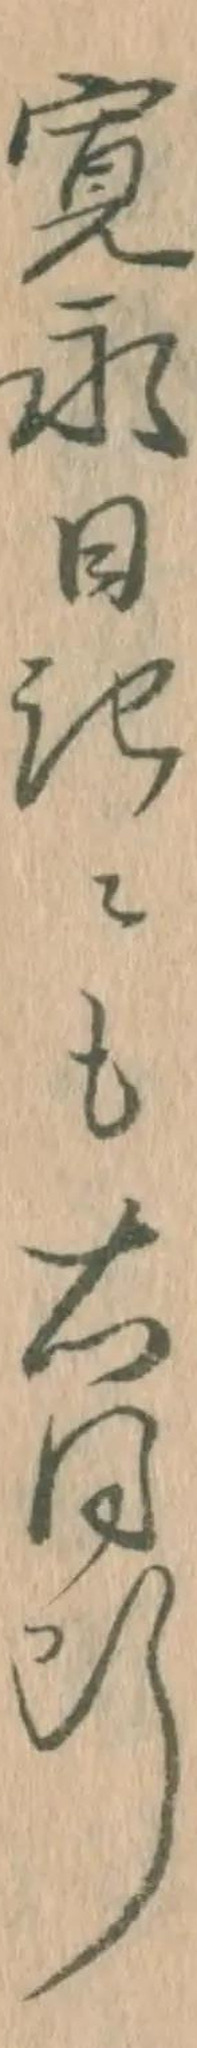寛永日記にも右同断
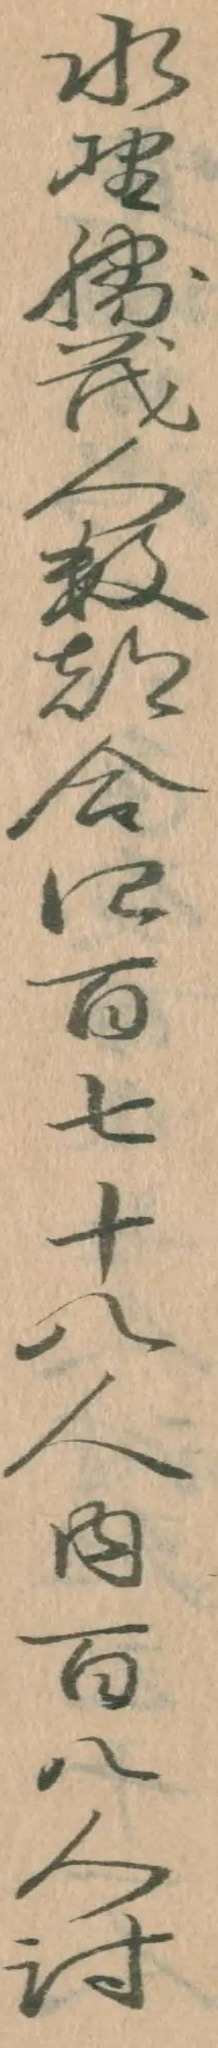水野勝茂人数都合四百七十八人内百八人討
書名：切支丹御退治記 49巻. [9]
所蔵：国立国会図書館 National Diet Library, JAPAN
